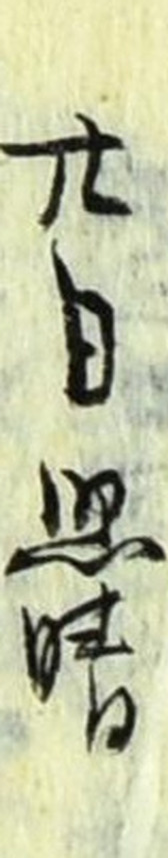廿日照晴
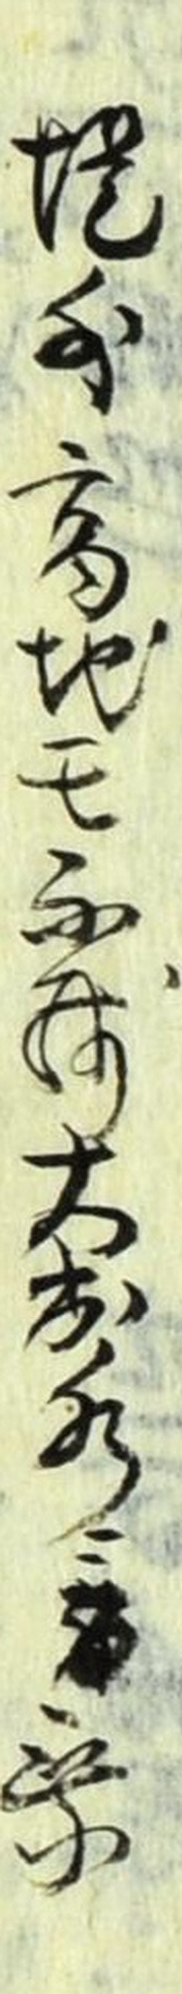堤外高地モ不残大出水ニ乗
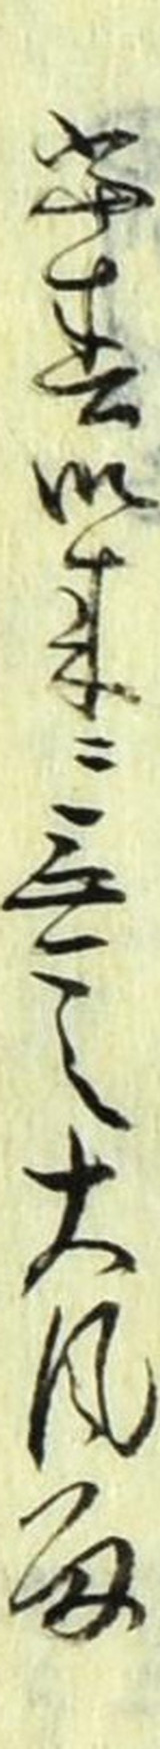当春以来ニ無之大風雨

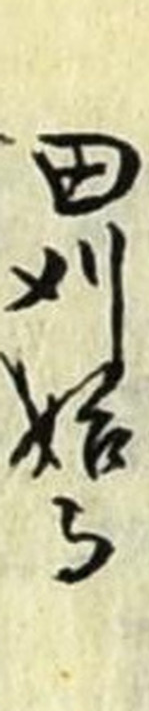田刈始る
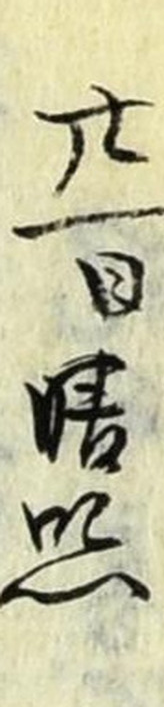廿六日晴照
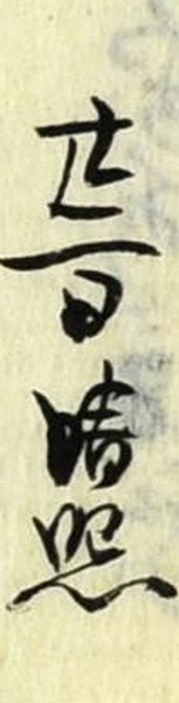廿六日晴照
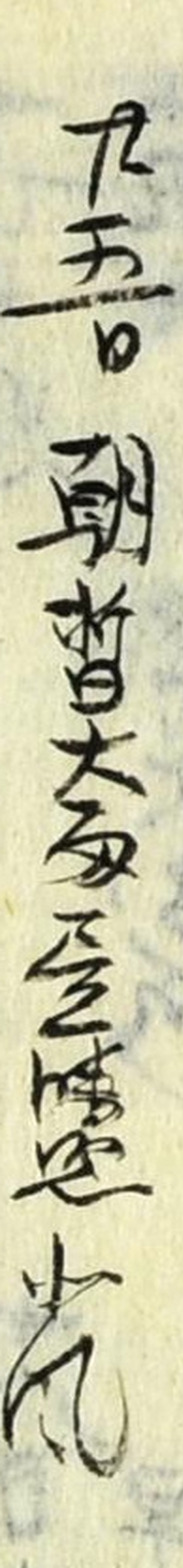廿五日朝暫大雨昼晴照北風
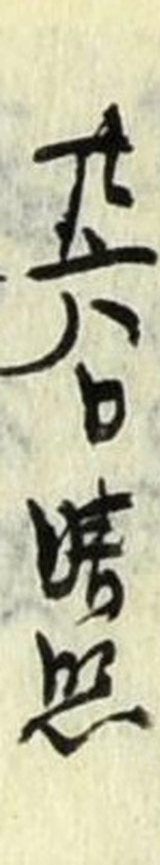廿六日晴照
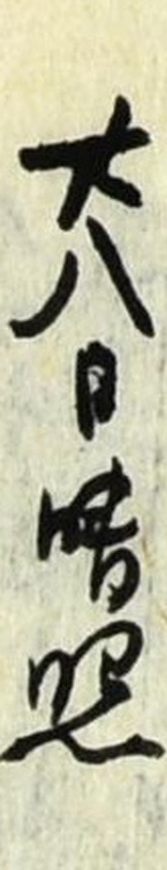廿八日晴照
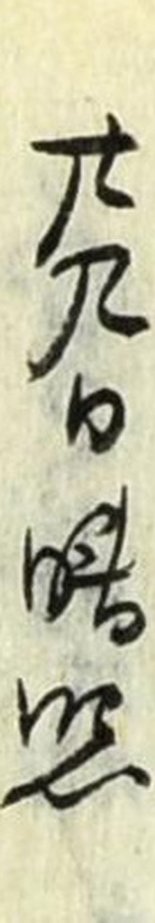廿九日晴照
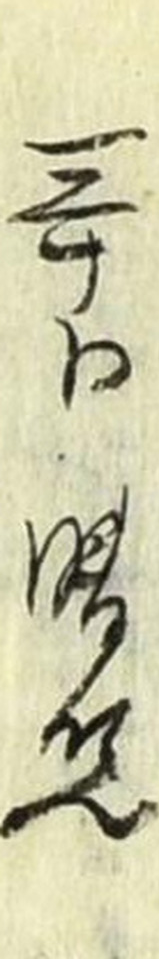三十日晴照
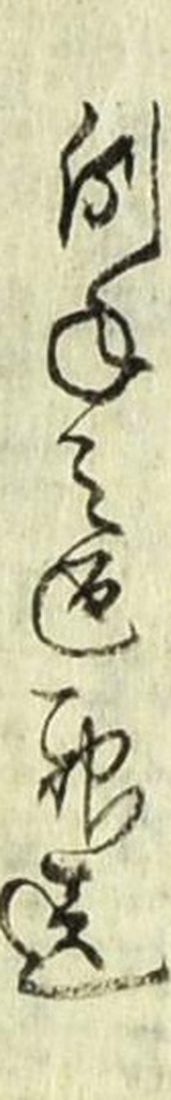例年之通神送
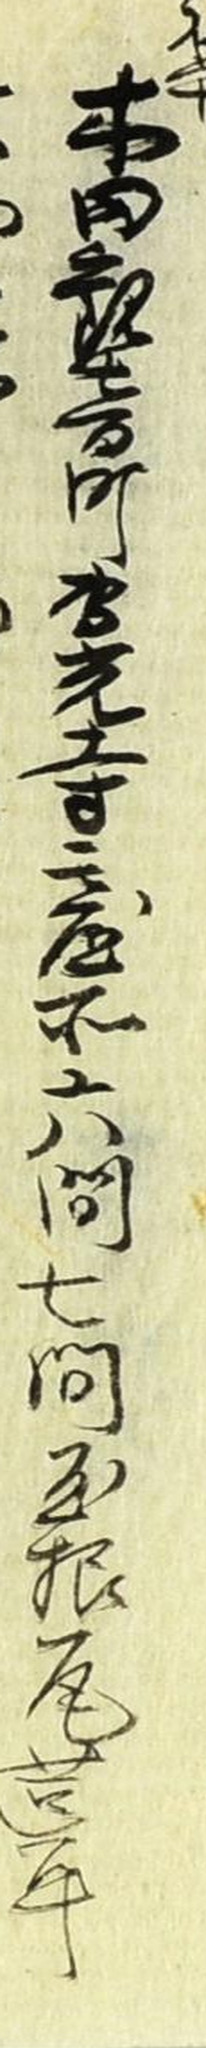木田観音町専光寺台所六間七間屋根瓦葺
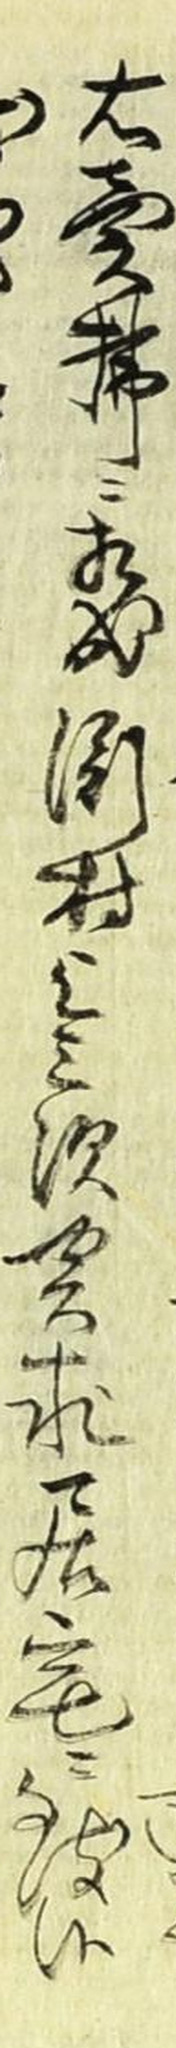右売払ニ相成淵村与三次買求居宅ニ致候
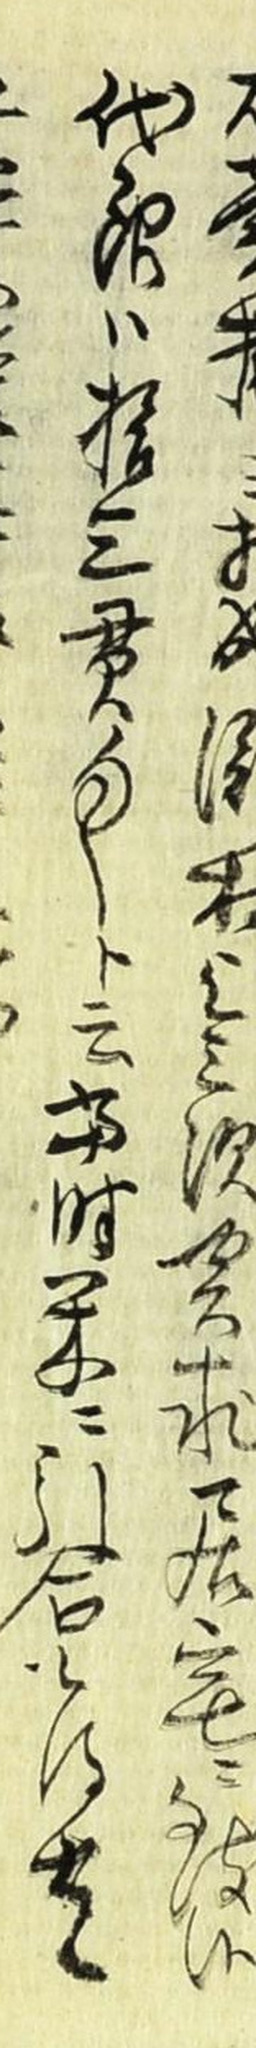代銀ハ拾三貫匁ト云当時米ニ引合候得者
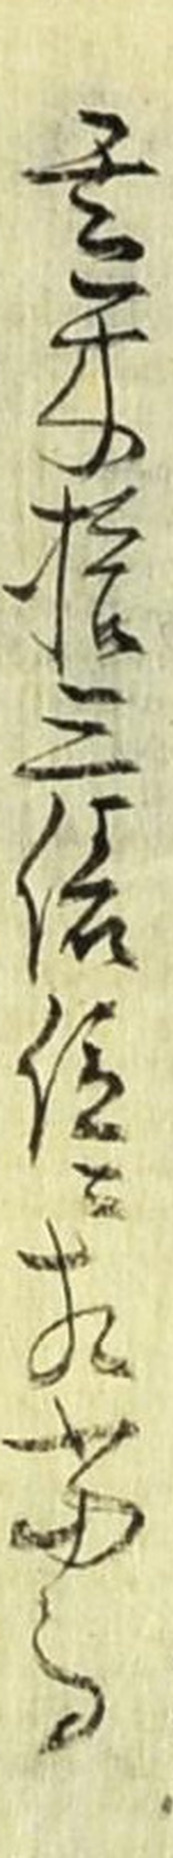玄米拾三俵位ニ相当る
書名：（日記）
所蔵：福井県文書館 Fukui Prefectural Archives
